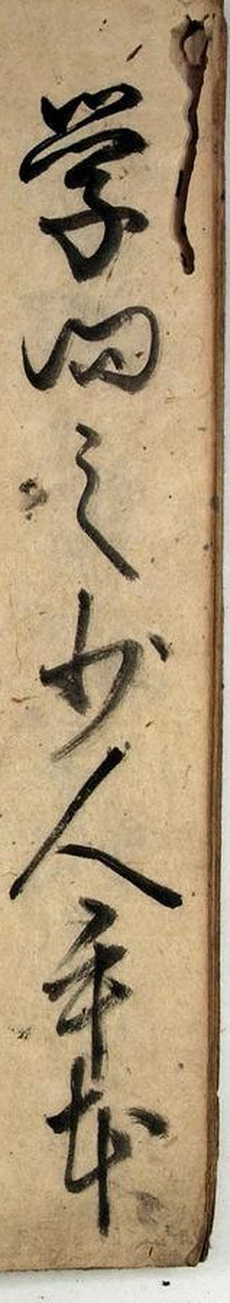学問之少人手本
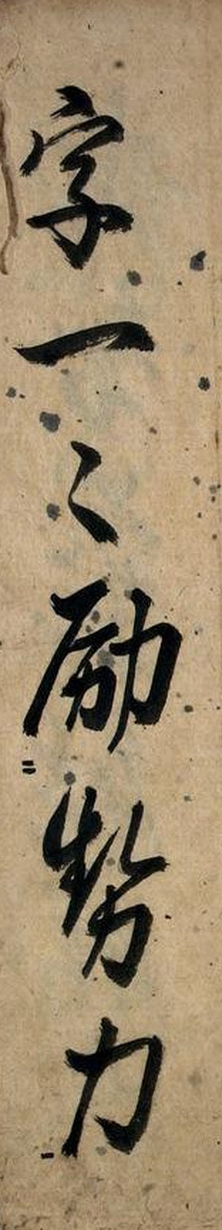字一〻励勢力

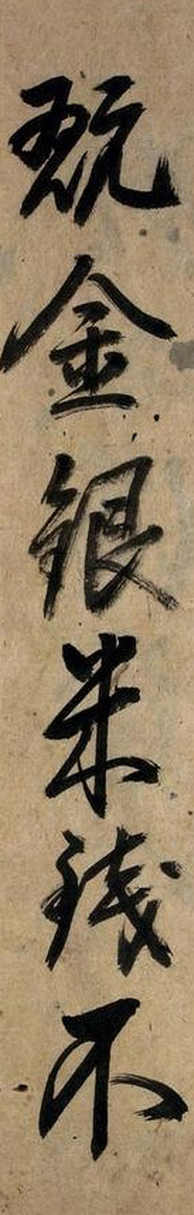翫金銀米銭不
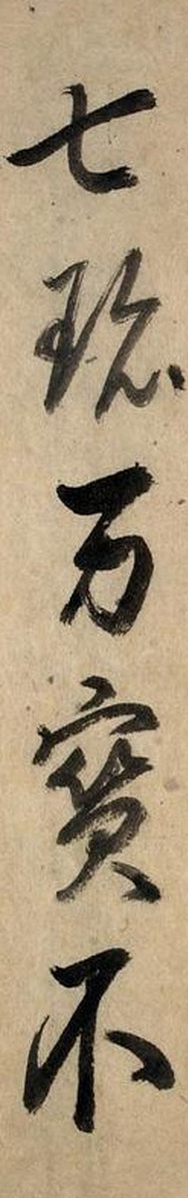七珍万宝不

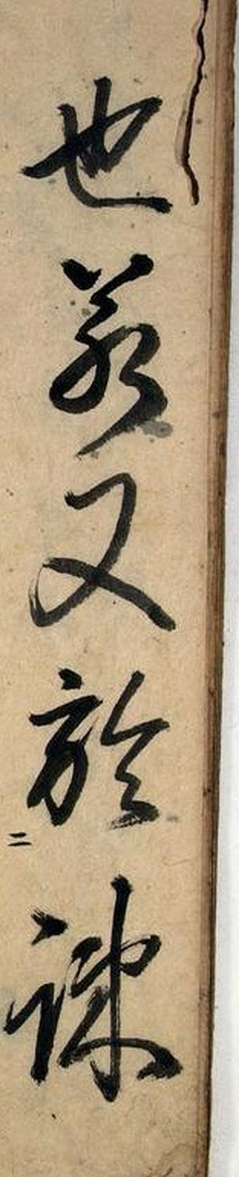也若又於疎

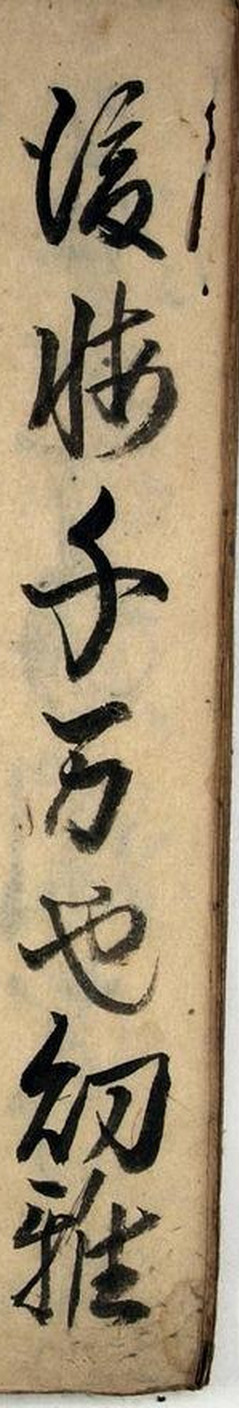後悔千万也幼稚

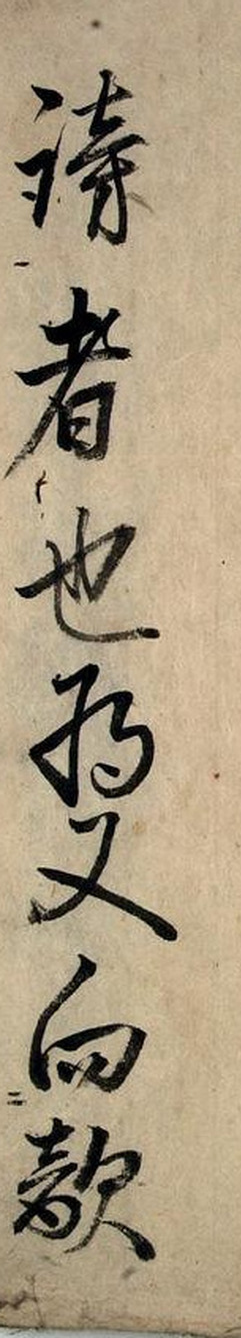謗者也将又向敵

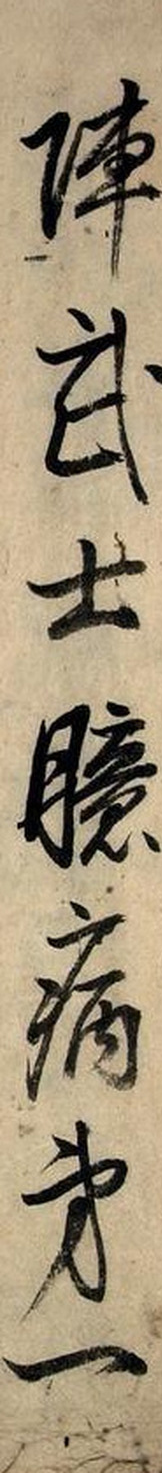陣武士臆病第一
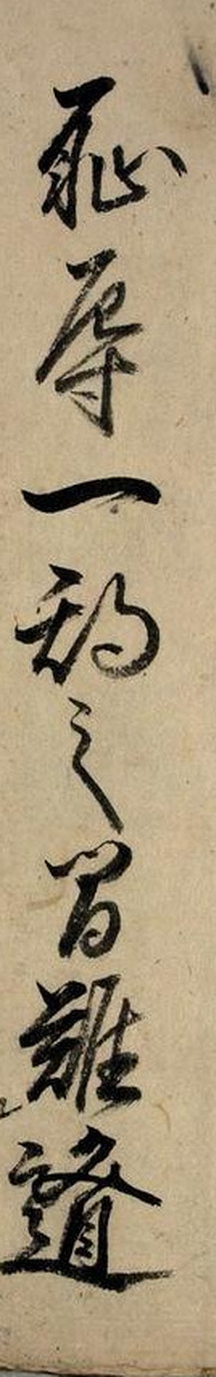恥辱一期之間難遁

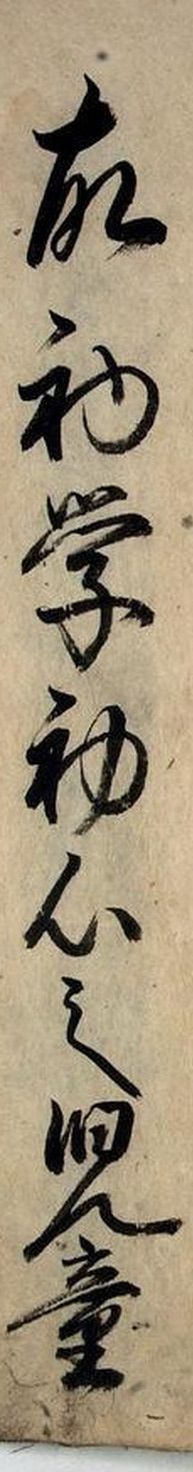故初学初心之児童

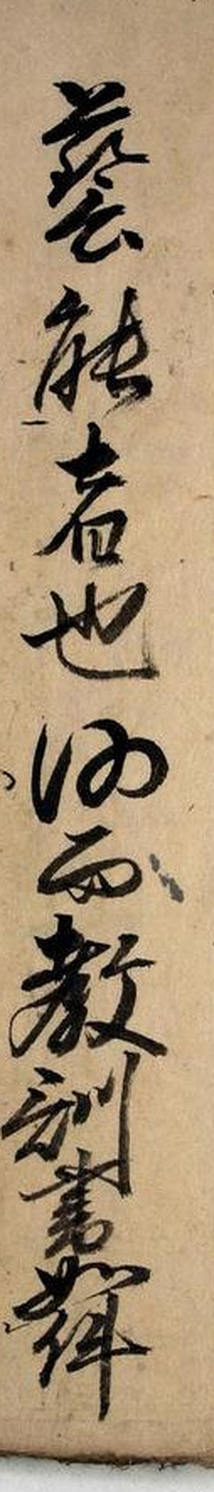芸能者也依而教訓書如件
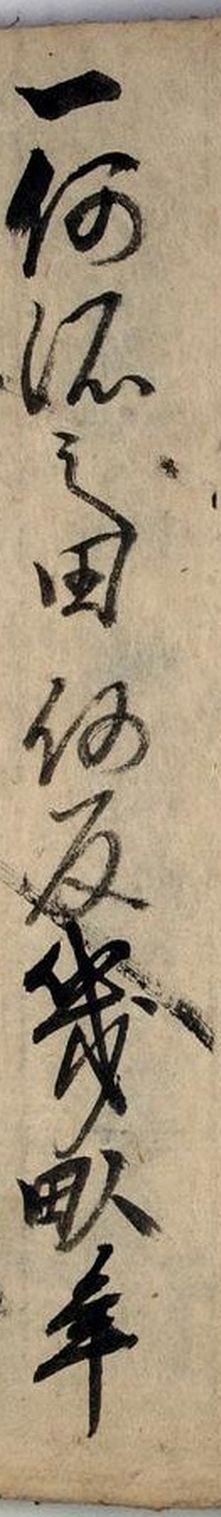一何所之田何反幾畝年
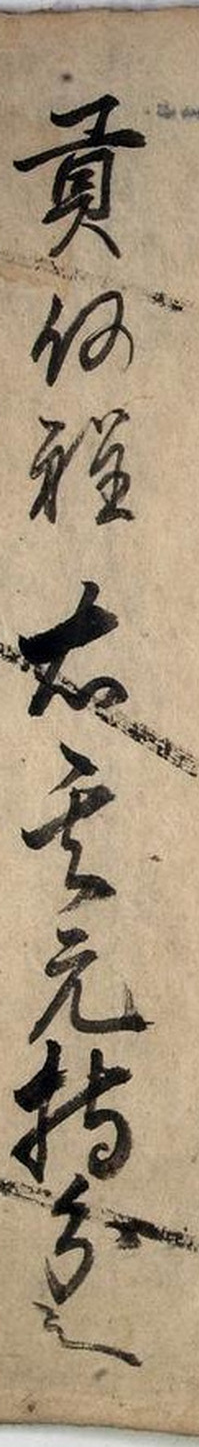貢何程右其元持分之

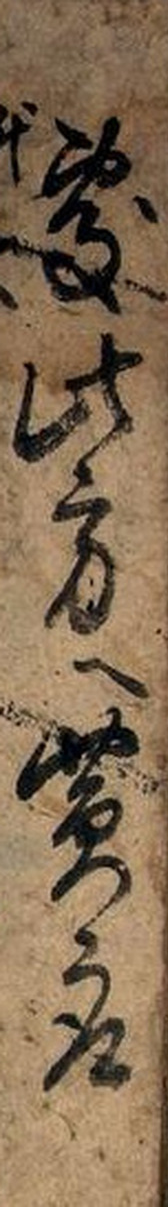処此方へ買取
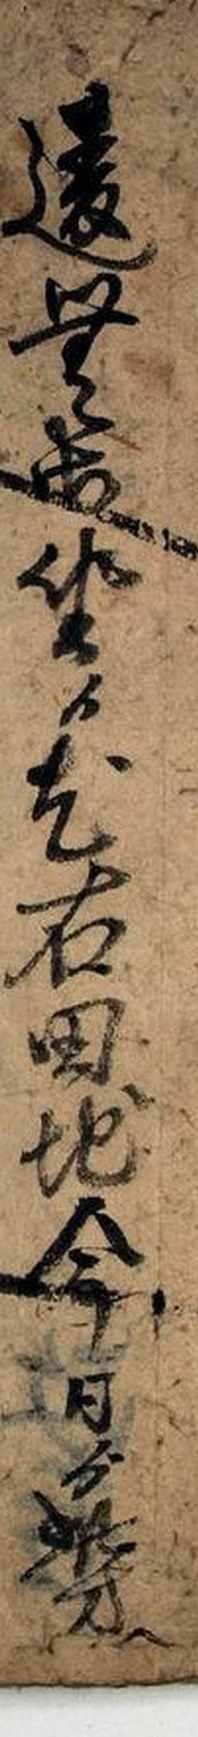違無御座候尤右田地今日ゟ此方へ
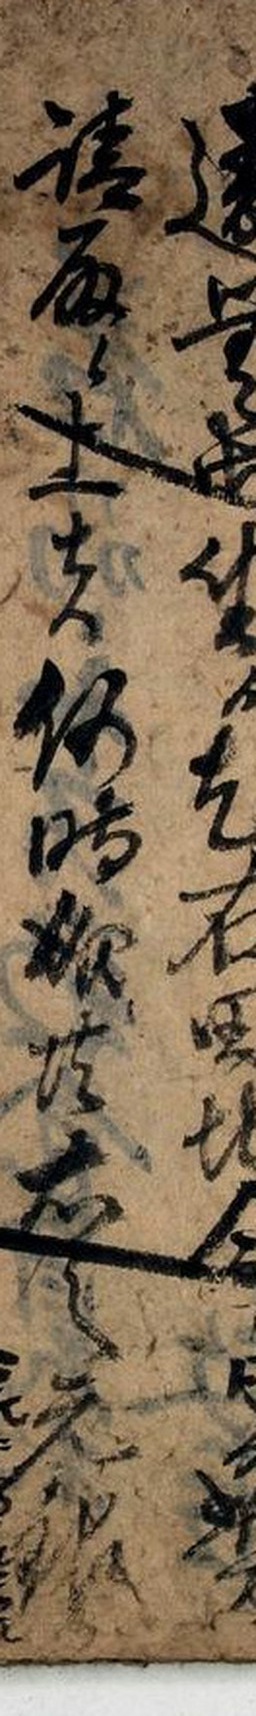請取候上は何時成共右之元銀
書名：教訓書手本（手習、初登山山手習教訓書）
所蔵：福井県文書館 Fukui Prefectural Archives
